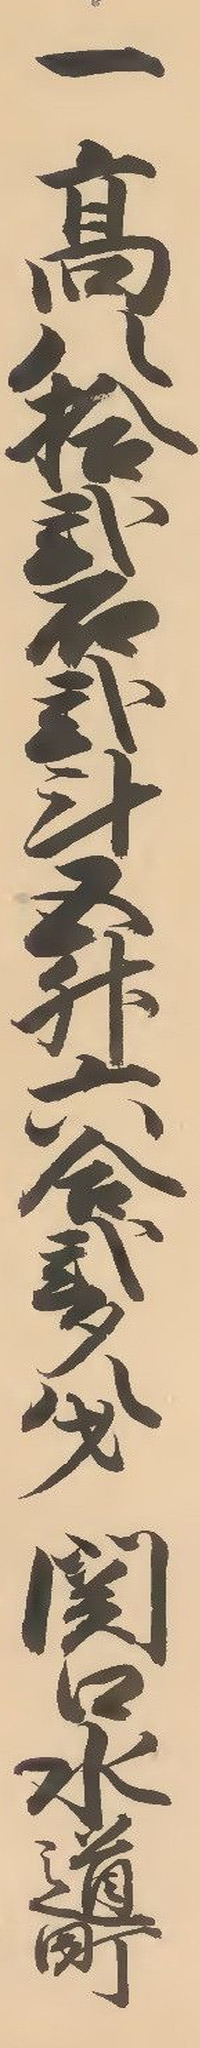一高八拾弐石弐斗五升六合弐勺八才関口水道町

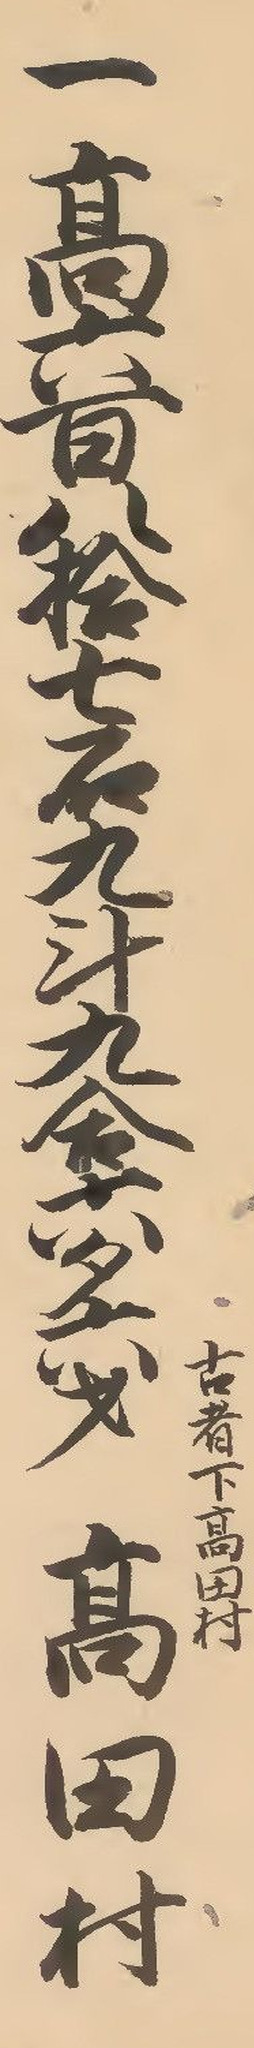一高六百八拾七石九斗九合六勺六才高田村
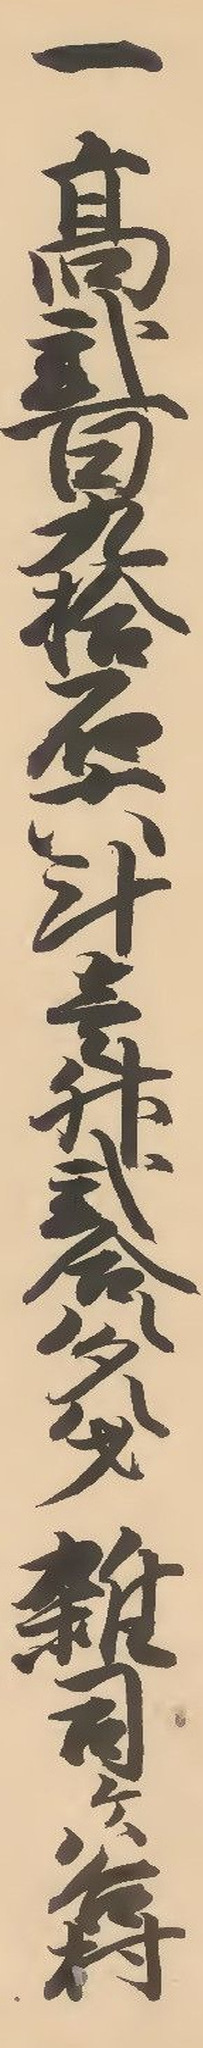一高弐百九拾石六斗壱升弐合八勺八才雑司ヶ谷村
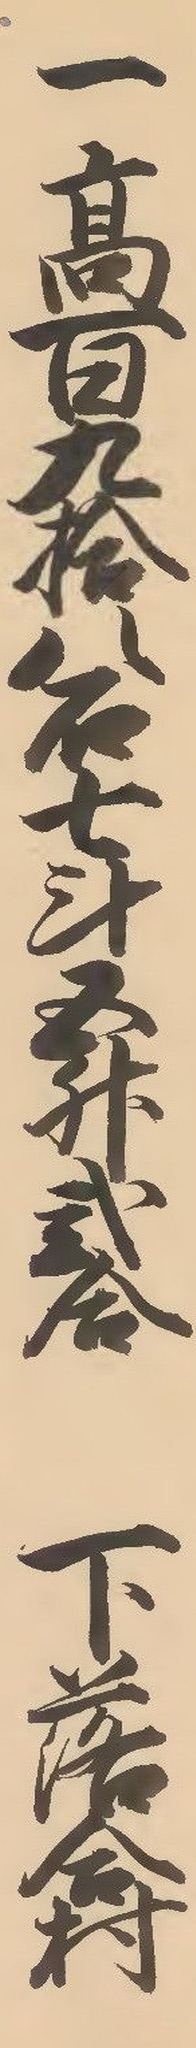一高百九拾八石七斗五升弐合下落合村
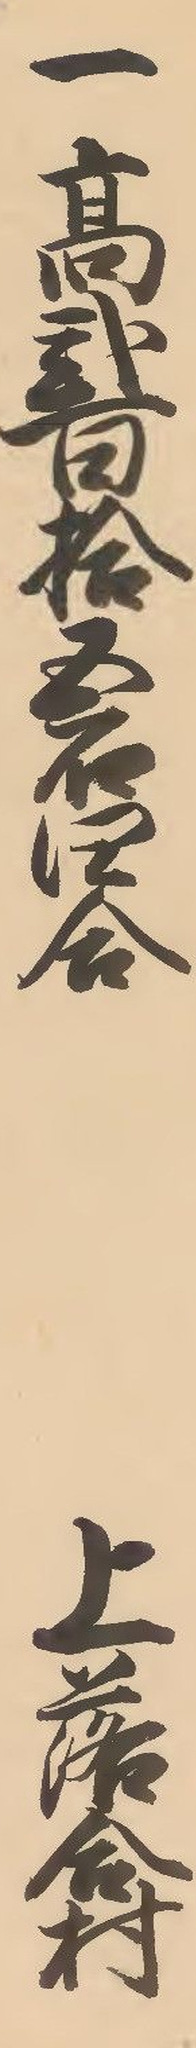一高弐百拾五石四合上落合村
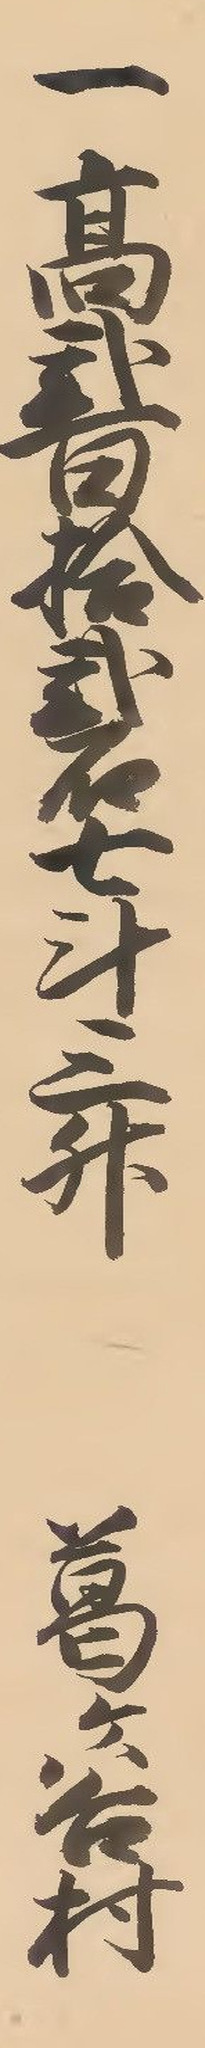一高弐百拾弐石七斗三升葛ヶ谷村
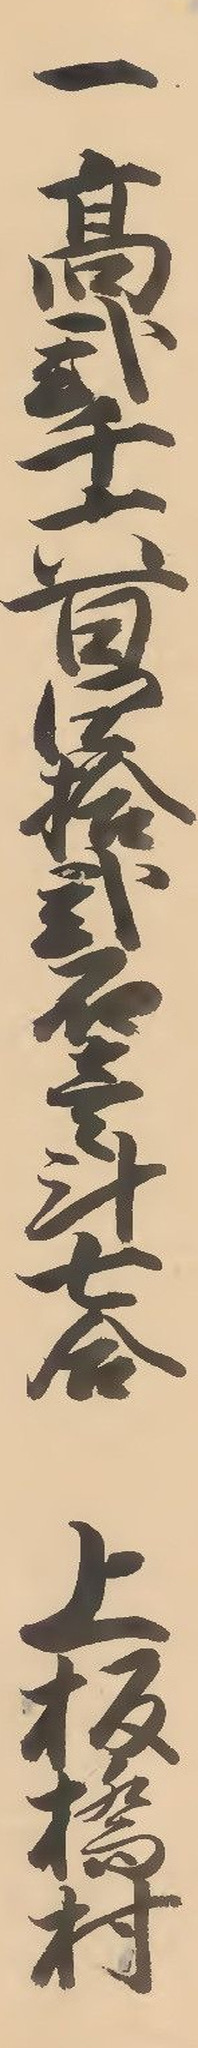一高弐千六百四拾弐石壱斗七合上板橋村
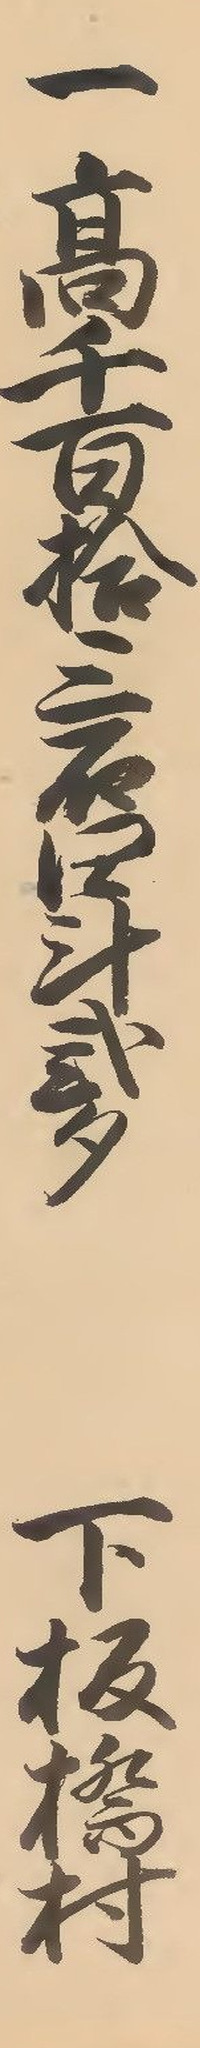一高千百拾三石四斗弐勺下板橋村

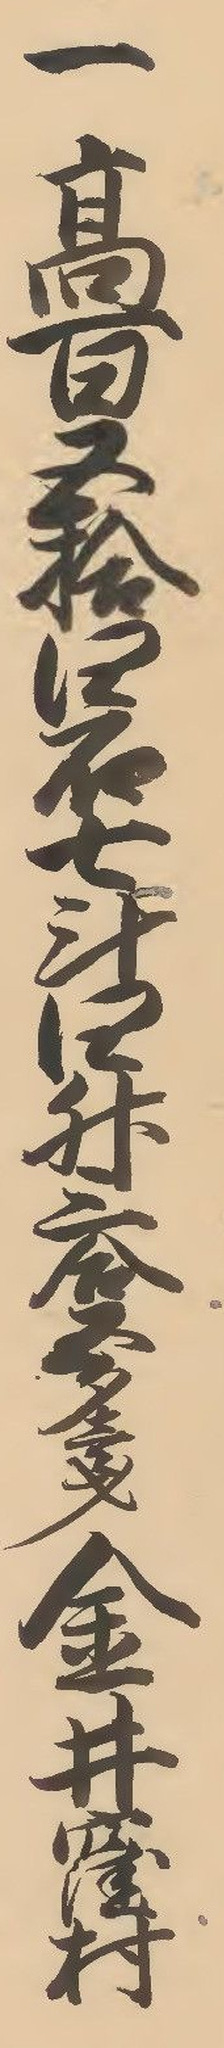一高百五拾四石七斗四升三合五勺壱才金井窪村
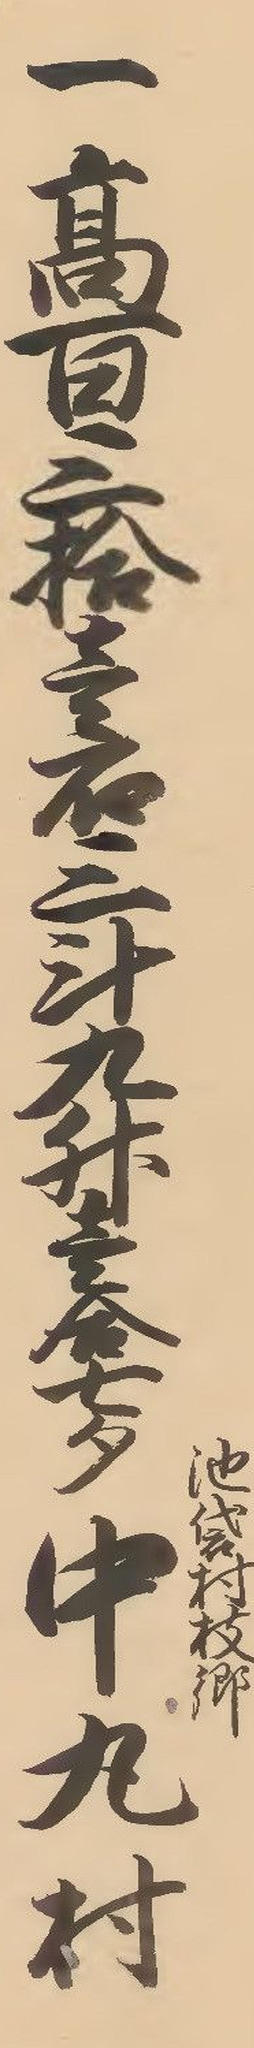一高百三拾壱石三斗九升壱合七勺中丸村
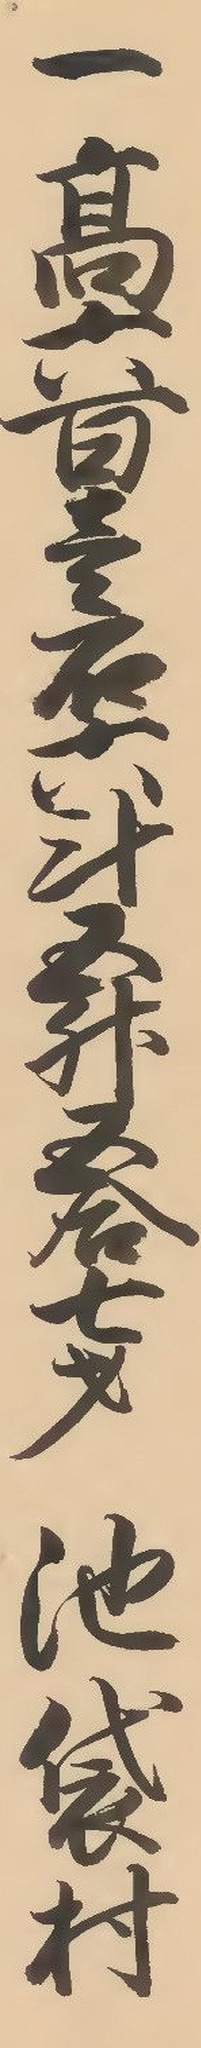一高六百壱石六斗五升五合七才池袋村
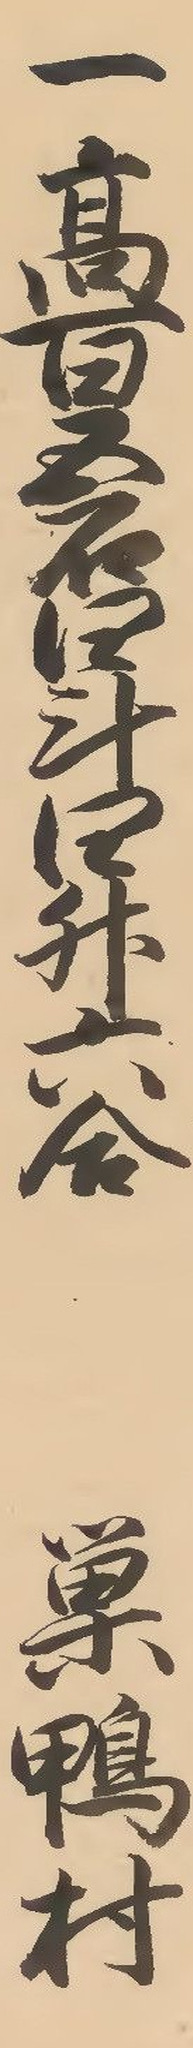一高百五石四斗四升六合巣鴨村
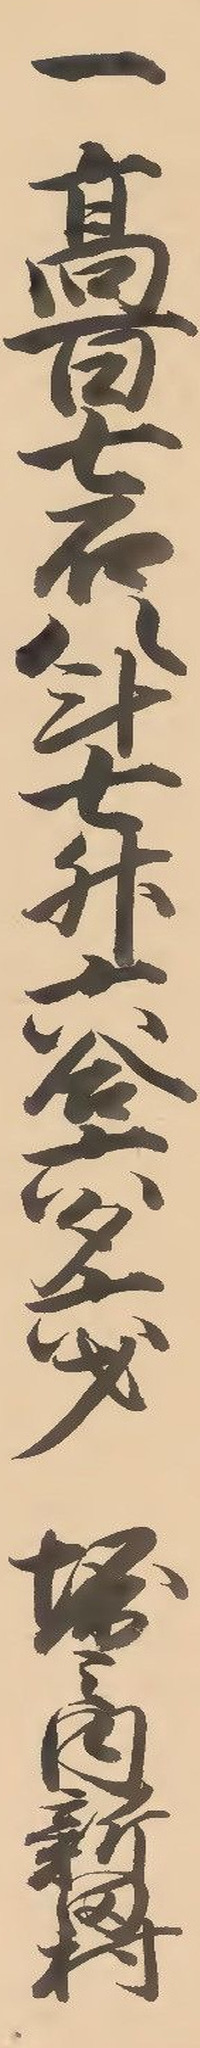一高百七石八斗七升六合六勺六才堀之内新田村
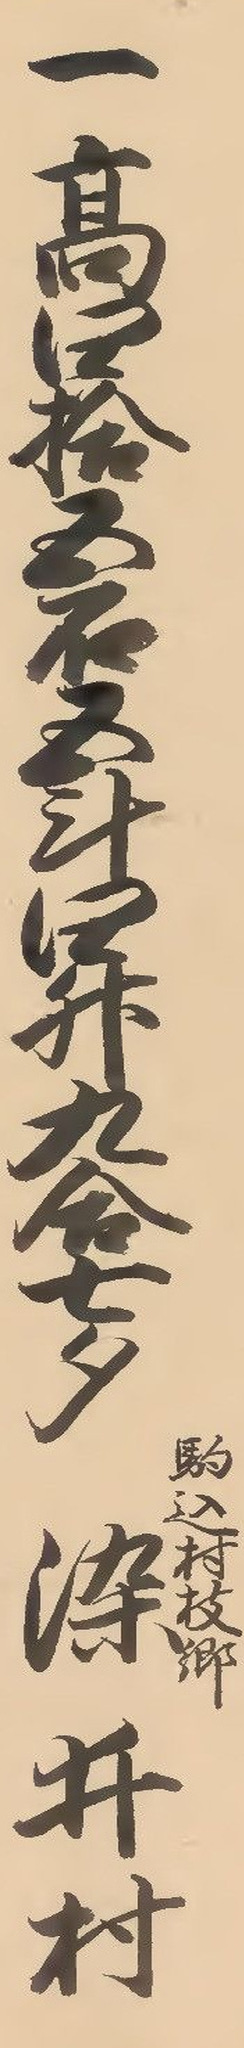一高四拾五石五斗四升九合七勺染井村
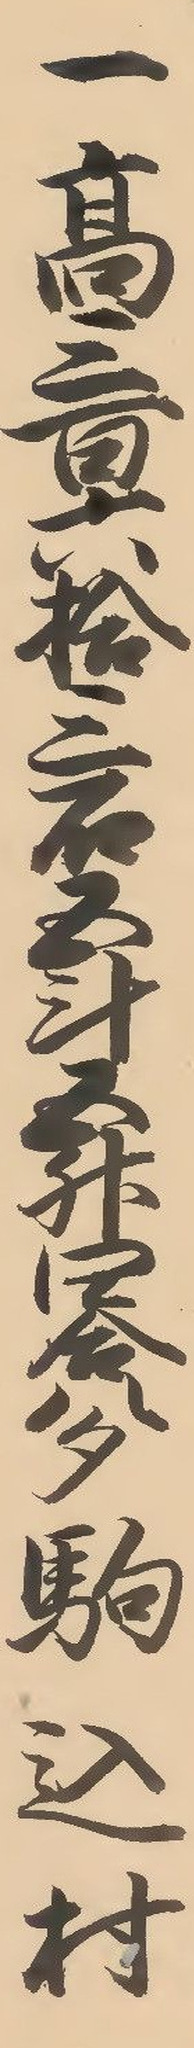一高三百六拾三石五斗五升四合八勺駒込村
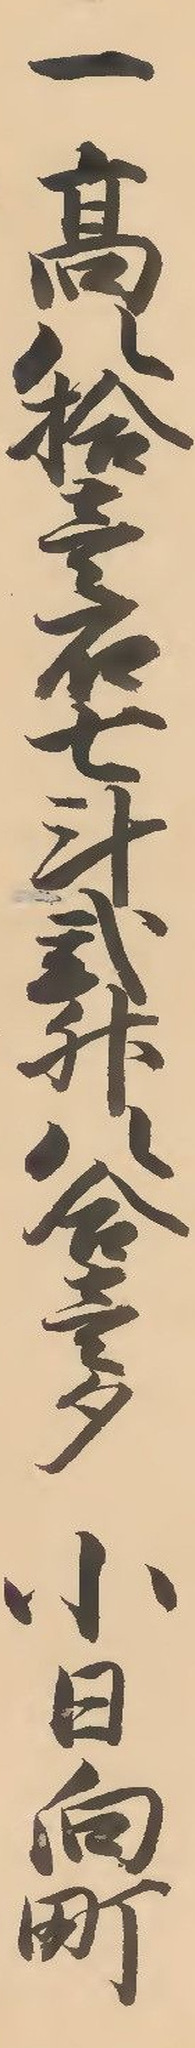一高八拾壱石七斗弐升八合壱勺小日向町
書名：武蔵国郷帳　上
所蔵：国立公文書館 National Archives of Japan
